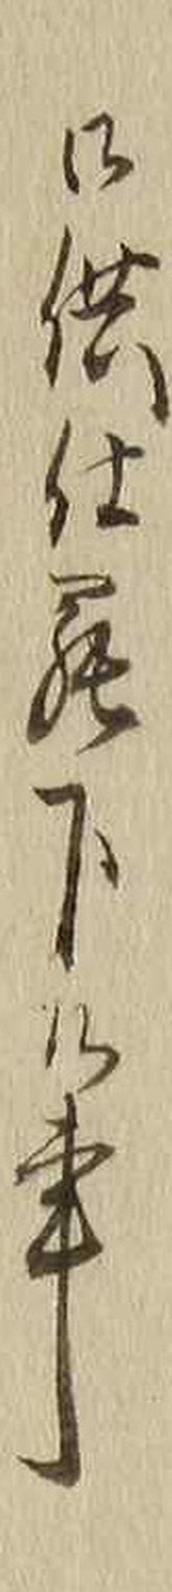御供仕罷下候事
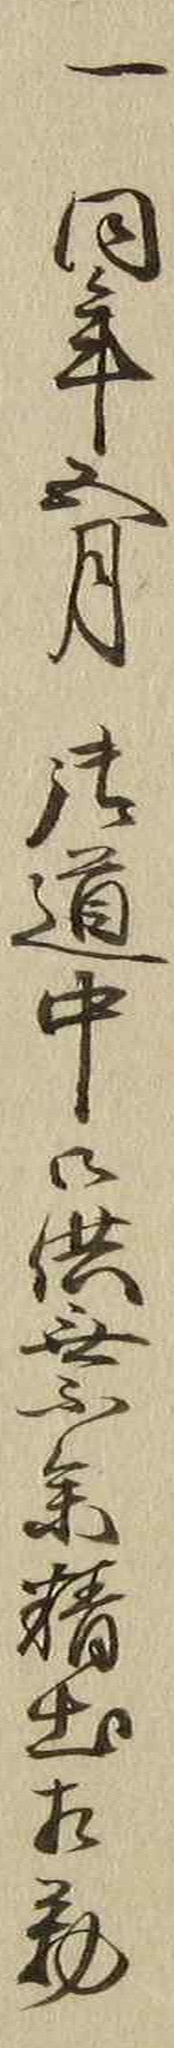一同年五月御道中御供無不参精出相勤
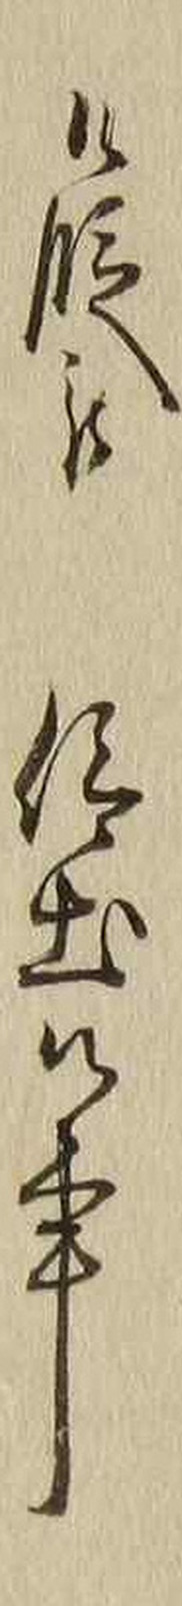候段被仰出候事
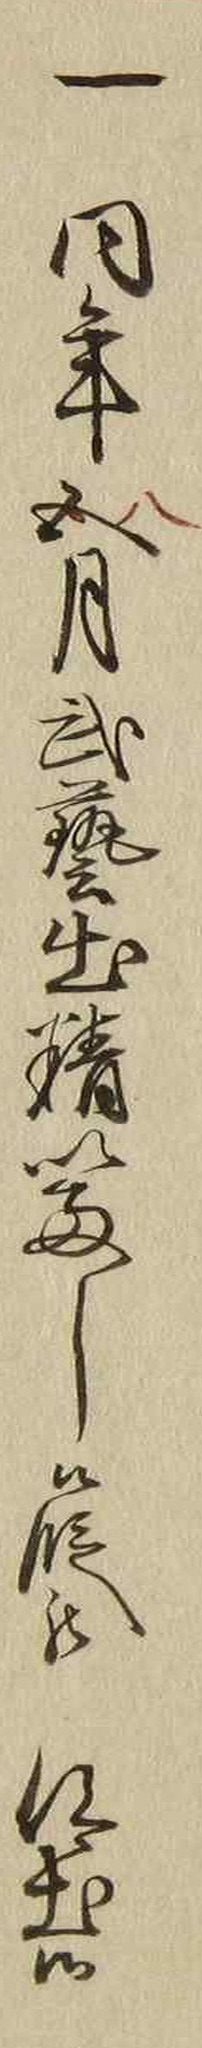一同年五月武芸出精いたし候段被仰出候
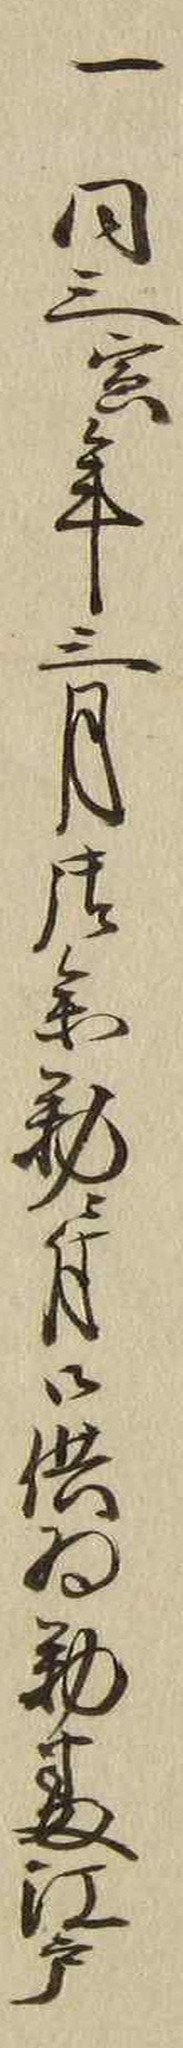一同三寅年三月御参勤に付御供為勤番江戸
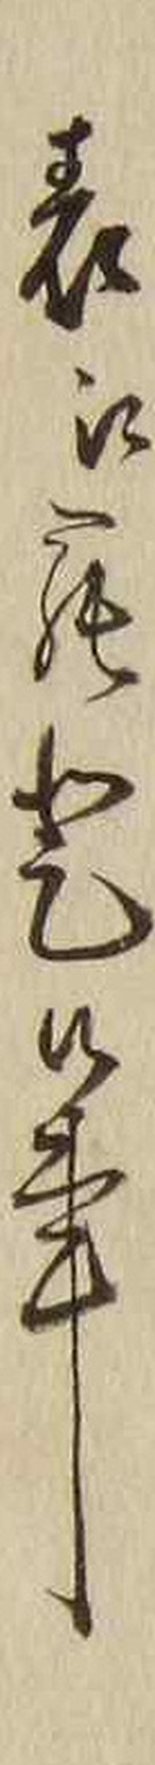表江罷登候事
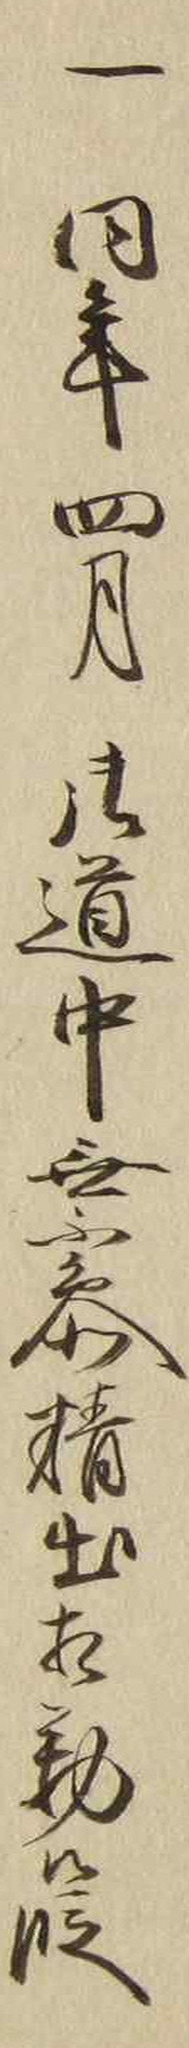一同年四月御道中無不参精出相動候段

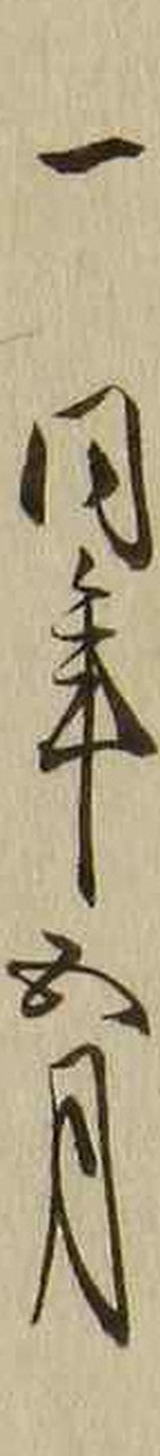一同年五月
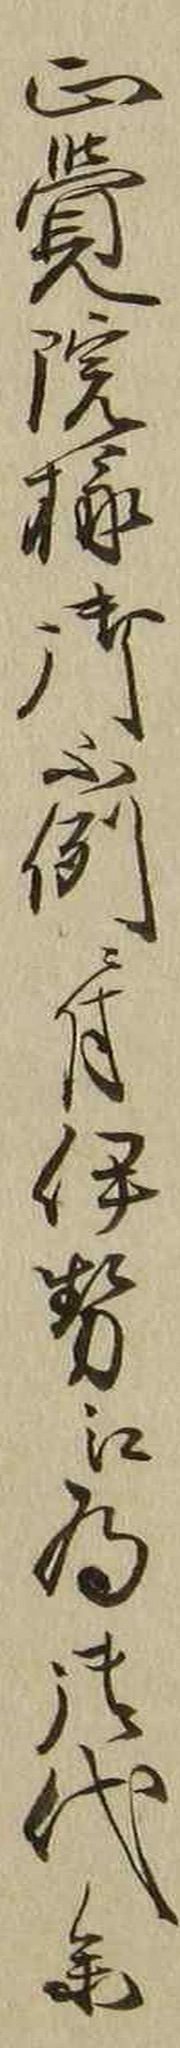正覚院様御不例に付伊勢江為御代参
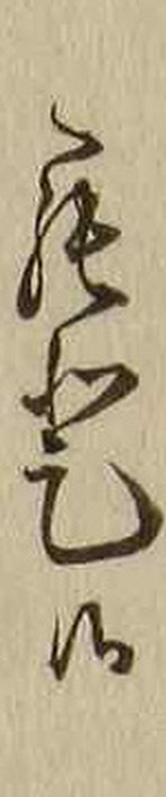罷登候
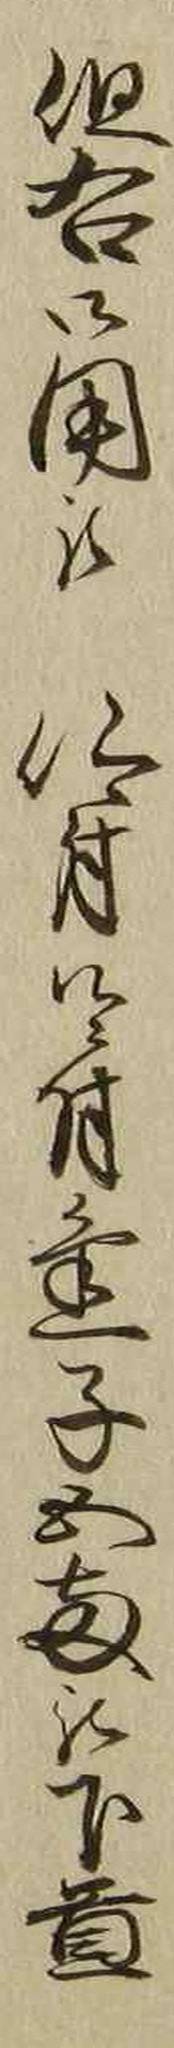但右御用被仰付候に付金子五両被下置
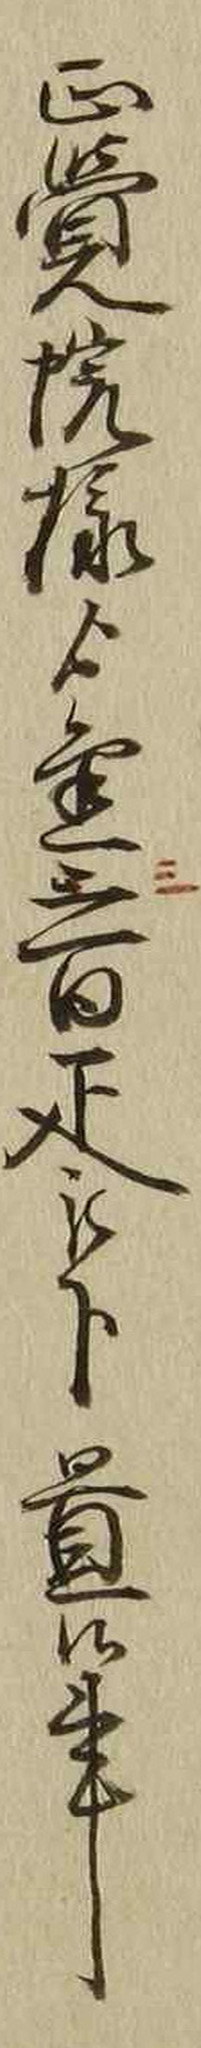正覚院様ゟ金三百疋下置候事
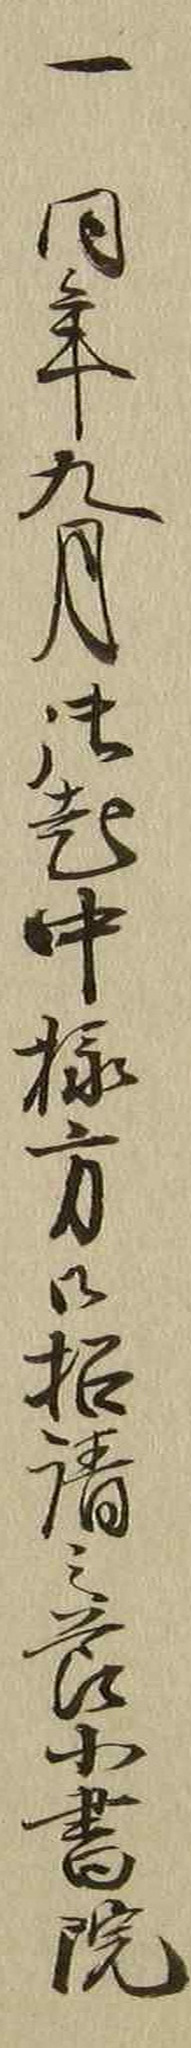一同年九月御老中様方御招請之節小書院
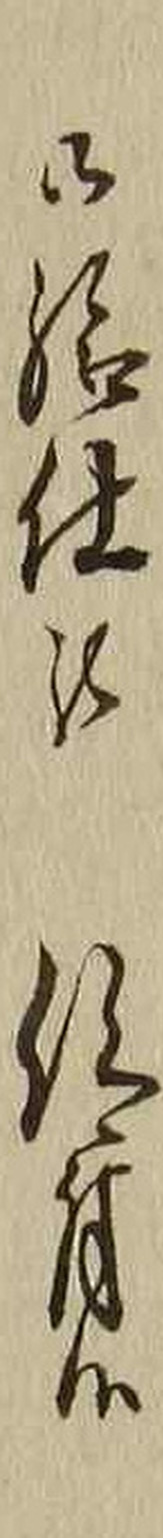御給仕被仰付候
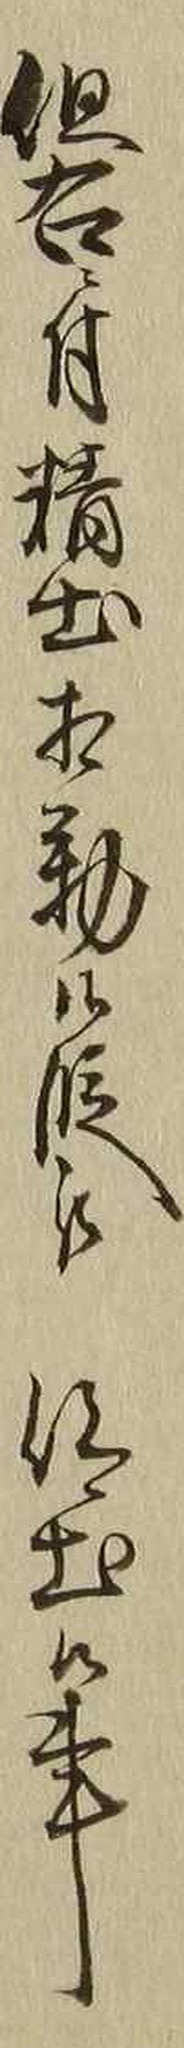但右に付精出相勤候段被仰出候事
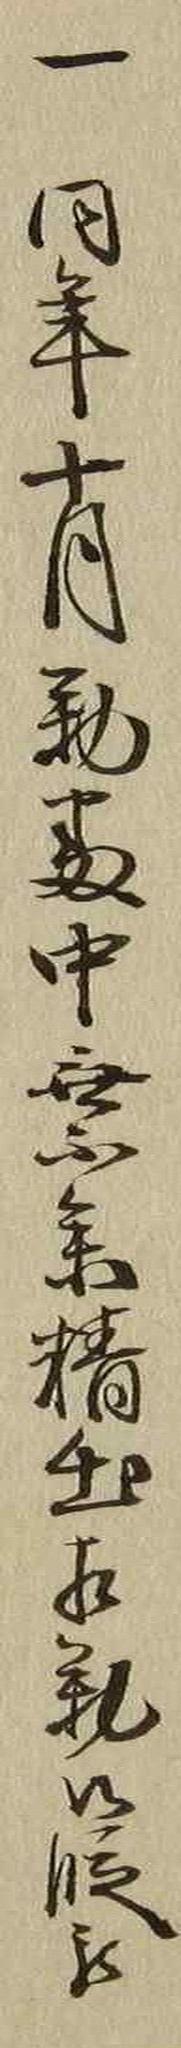一同年十月勤番中無不参精出相勤候段被
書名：諸士系譜　巻之67　を之部1
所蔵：会津若松市立会津図書館
